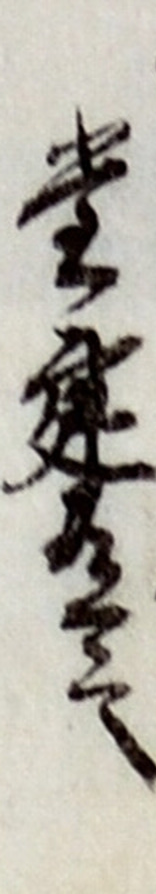堂建有之
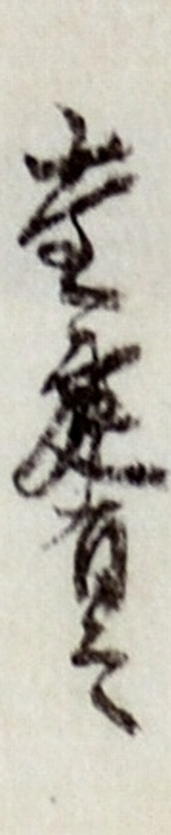宮建有之
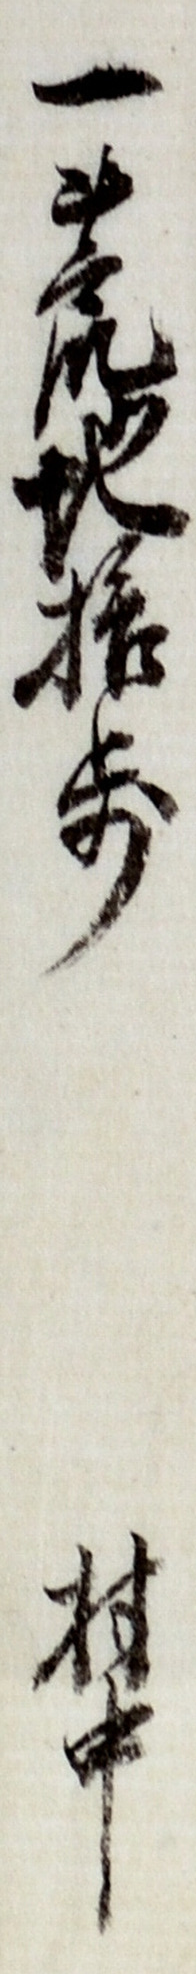一荒地拾歩村中
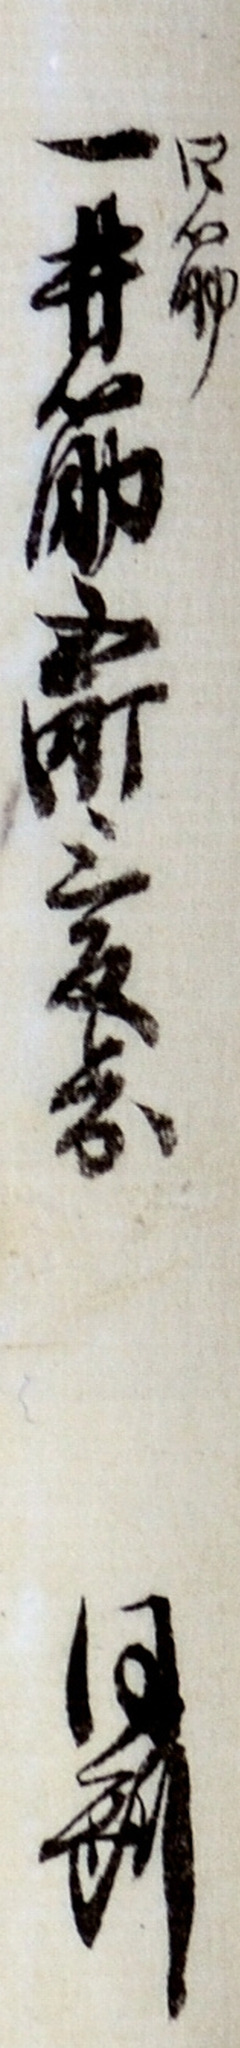一井筋五町三反歩同断
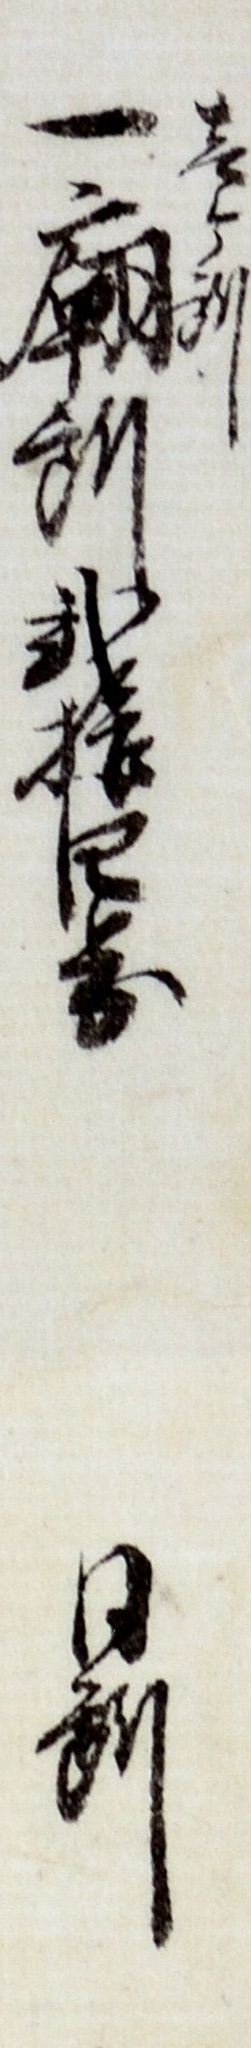一廟所弐拾四歩同断
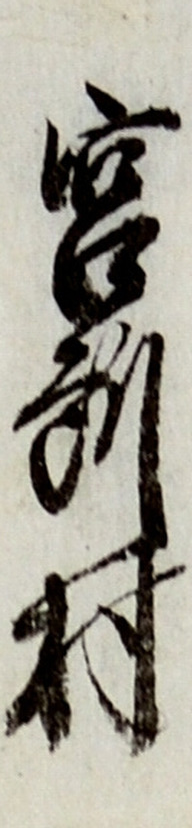宮所村
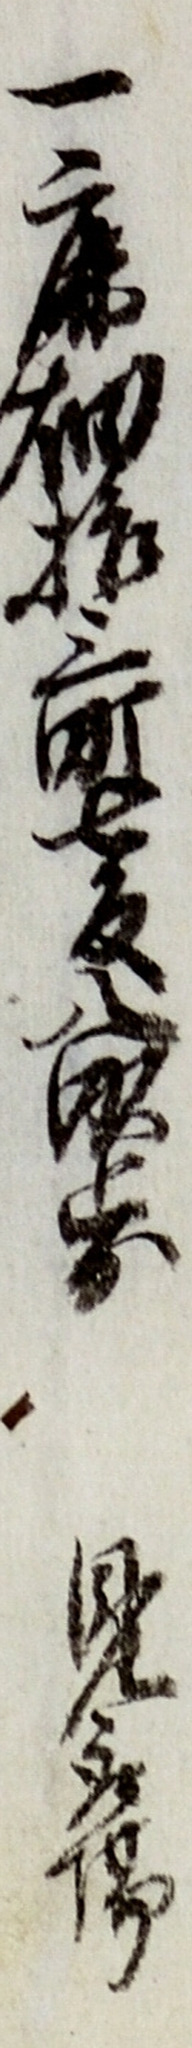一麻畑拾三町七反八畝歩見取場
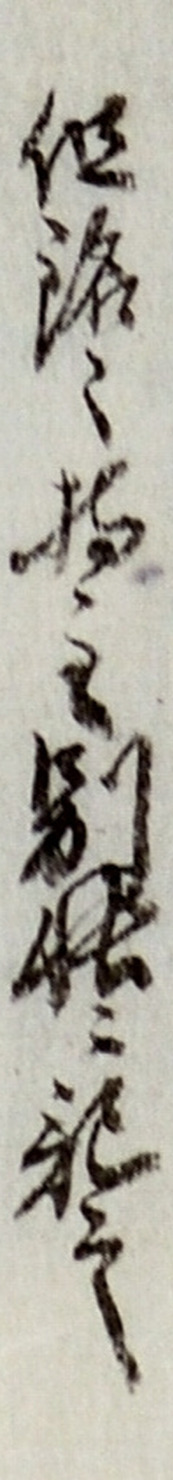但銘々持主別帳ニ記之
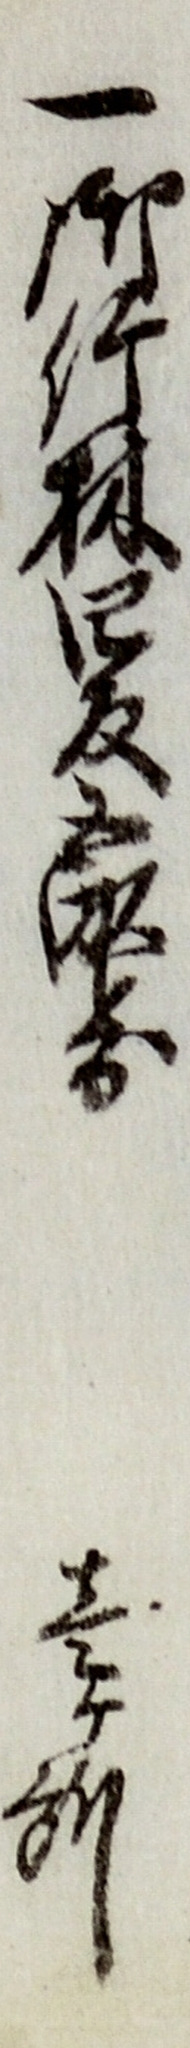一御竹林四反五畝歩壱ヶ所
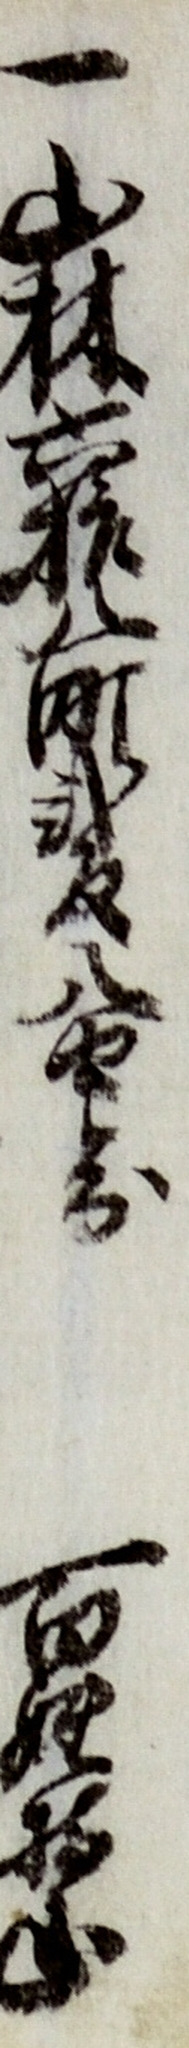一山林六拾八町弐反八セ歩百姓持山
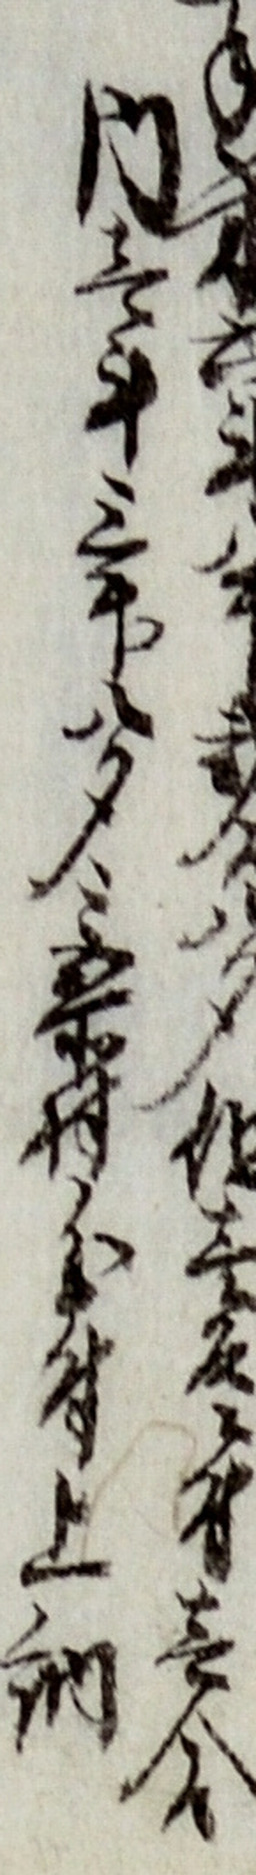内壱斗三升八勺宮所村分付上納

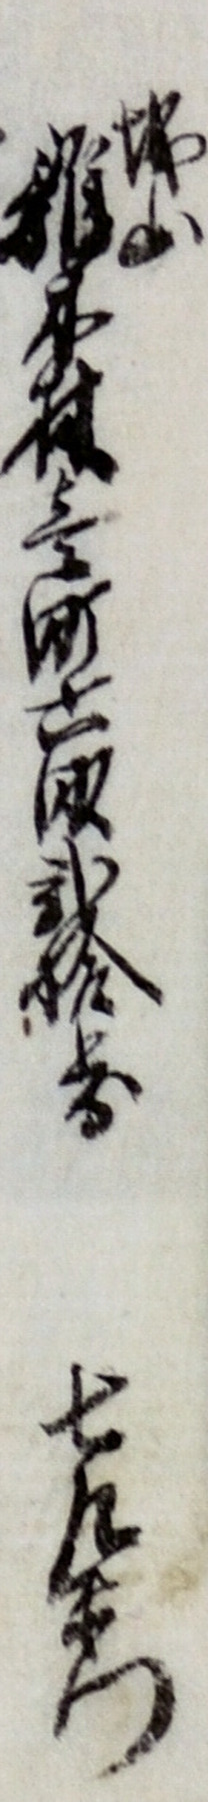雑木林壱町六畝弐拾歩七左衛門
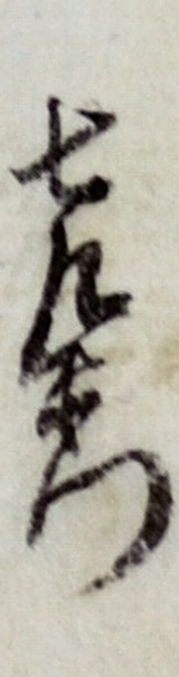六左衛門
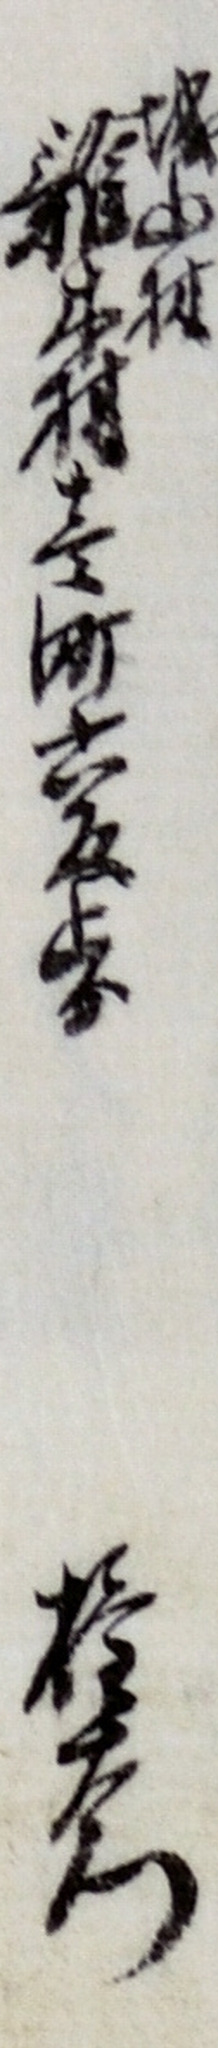雑木林壱町六反歩権右衛門
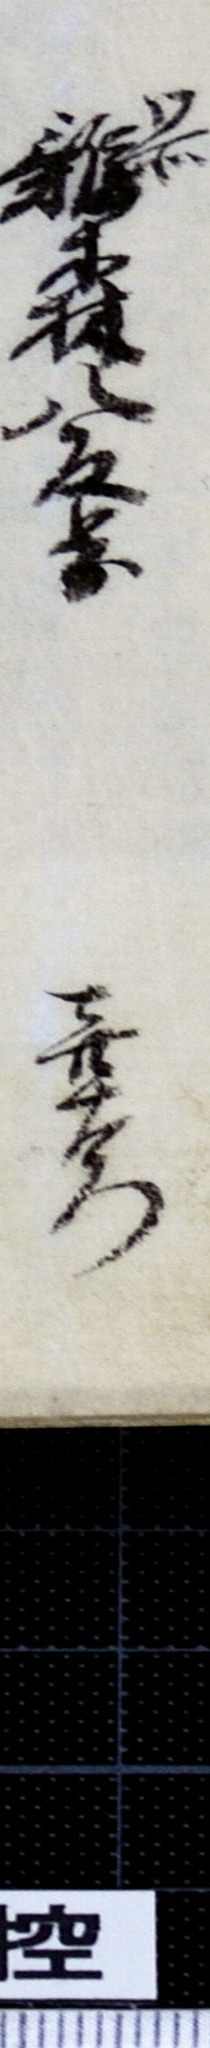雑木林八反歩喜右衛門
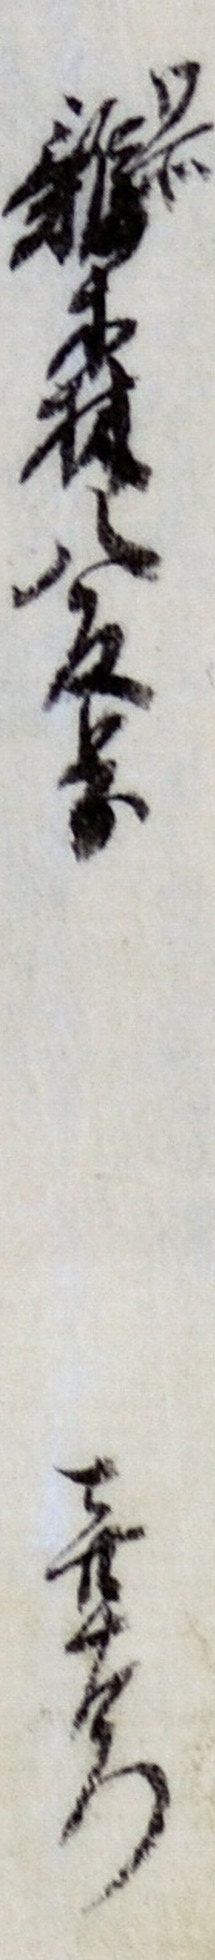雑木林八反歩喜右衛門
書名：御領分中山林社地手控
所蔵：伊那市立高遠町図書館・合同会社AMANE
